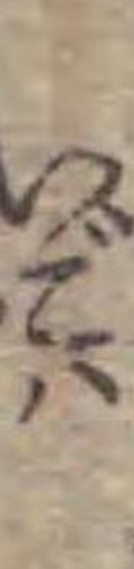いごは
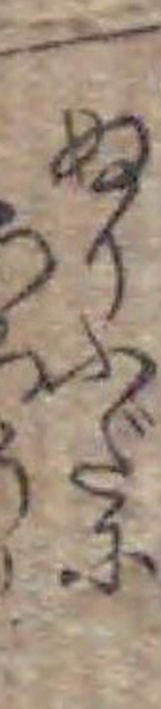ぬりふだに
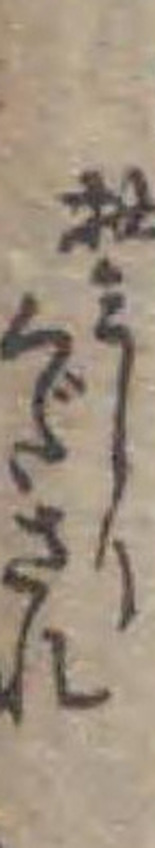おみしり
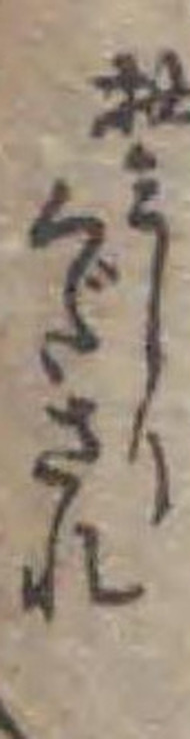くだされ
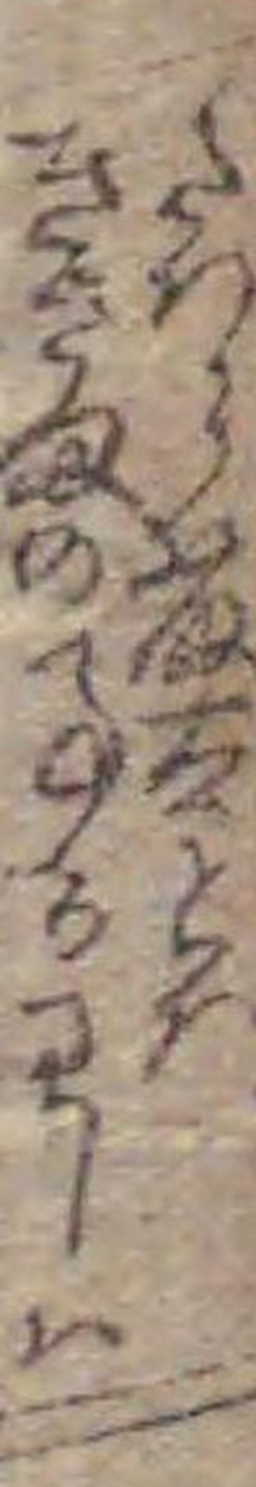きさまの事かわしは
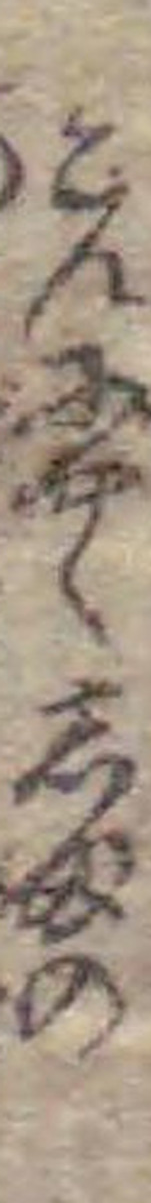こんにやくしまの
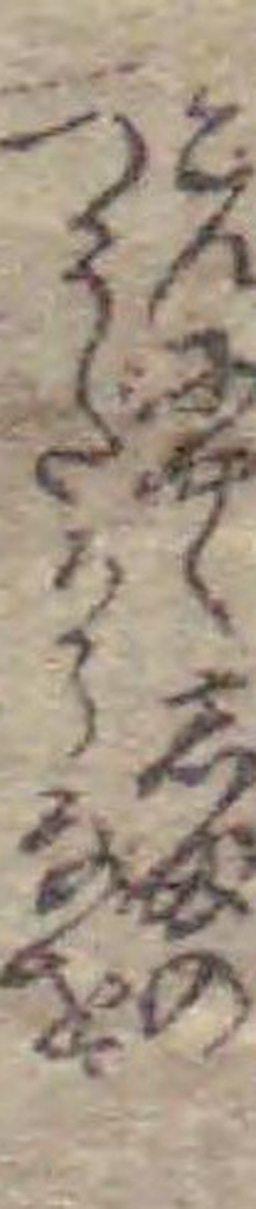つうだからなを
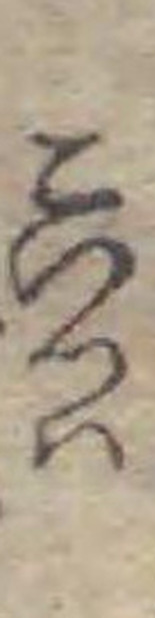こいつは
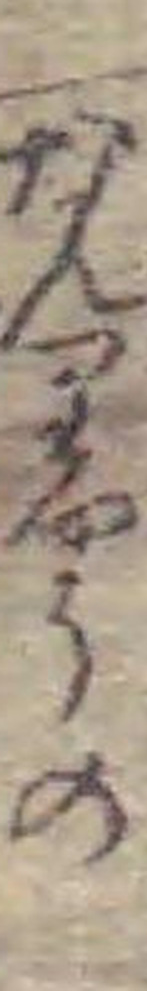なんりやうの
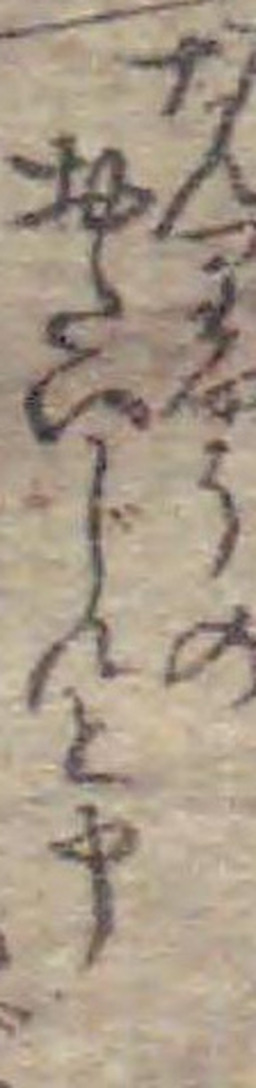おたいじんと申
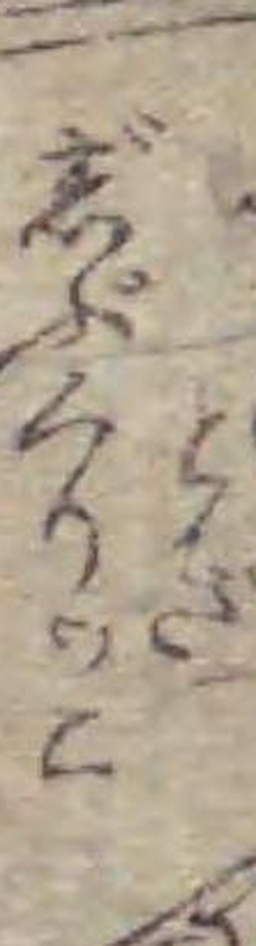じぶくりッこ

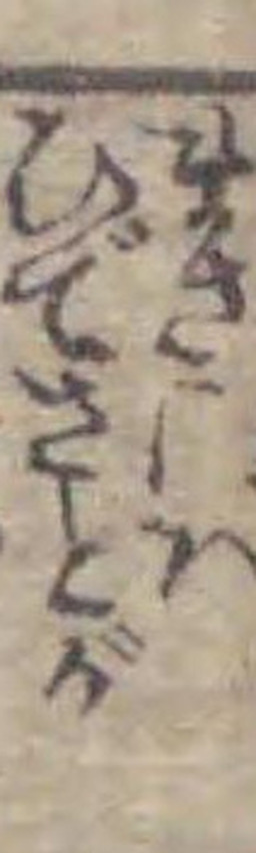ひでさとが
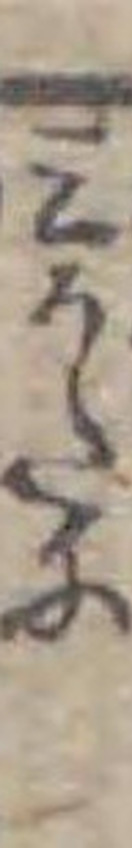みかたに
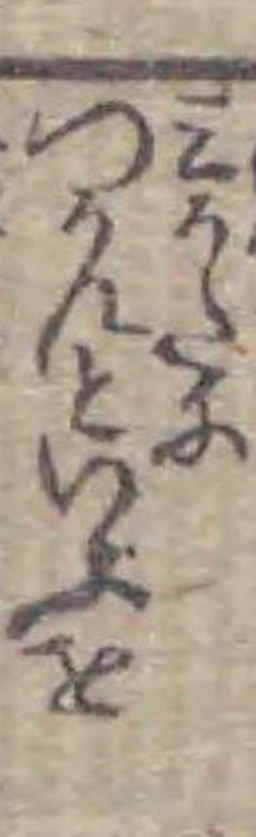つかんといふを
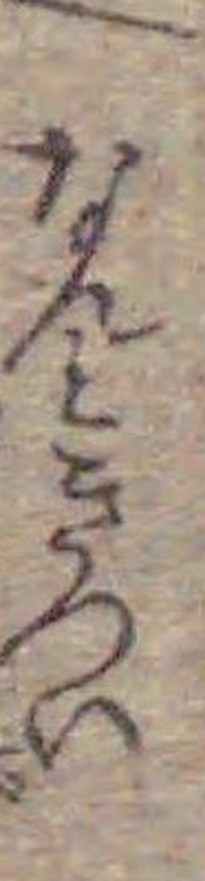なんときつい
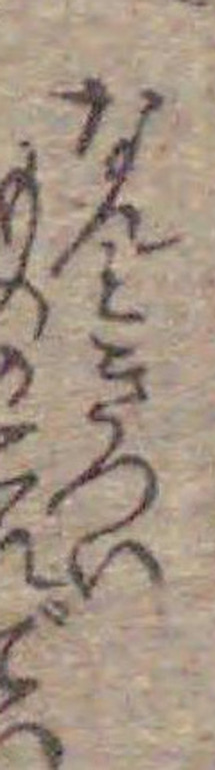なんときつい
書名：時代世話二挺皷 : 2巻
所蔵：国立国会図書館 National Diet Library, JAPAN
